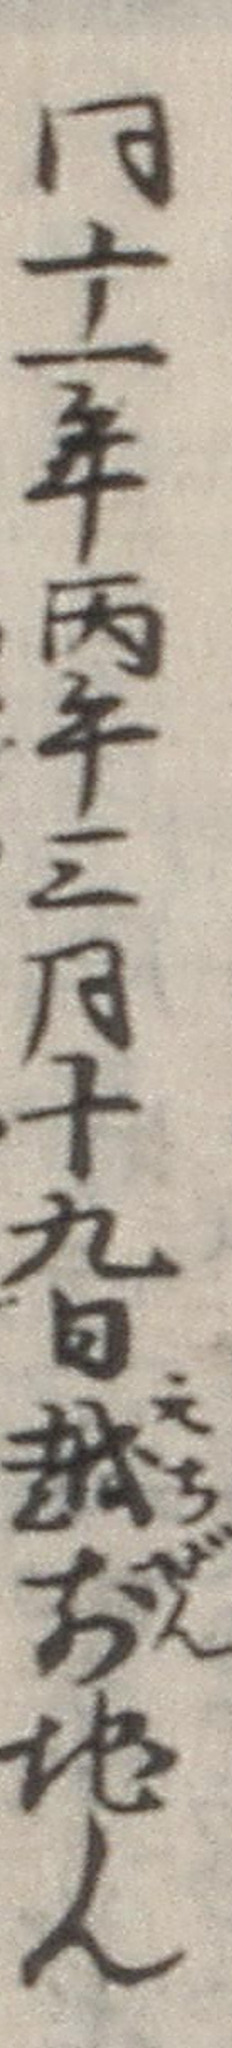同十一年丙午三月十九日越前地しん
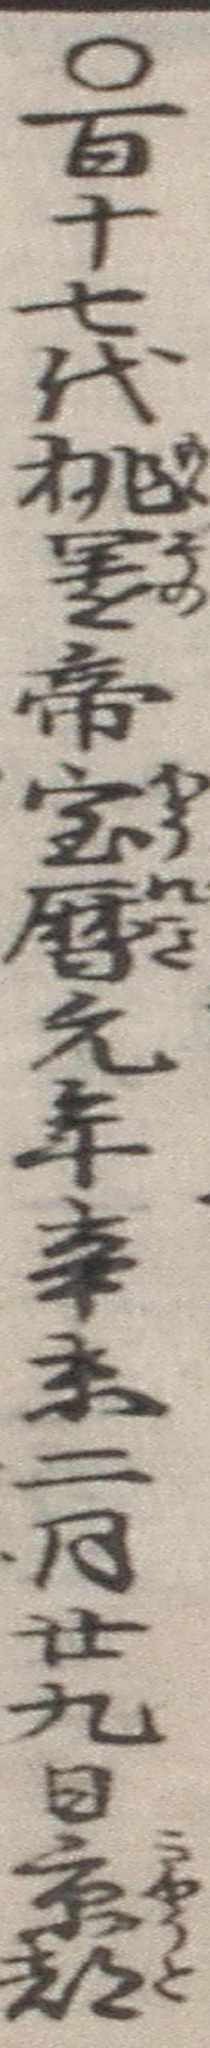○百十七代桃園帝宝暦元年辛未二月廿九日京都
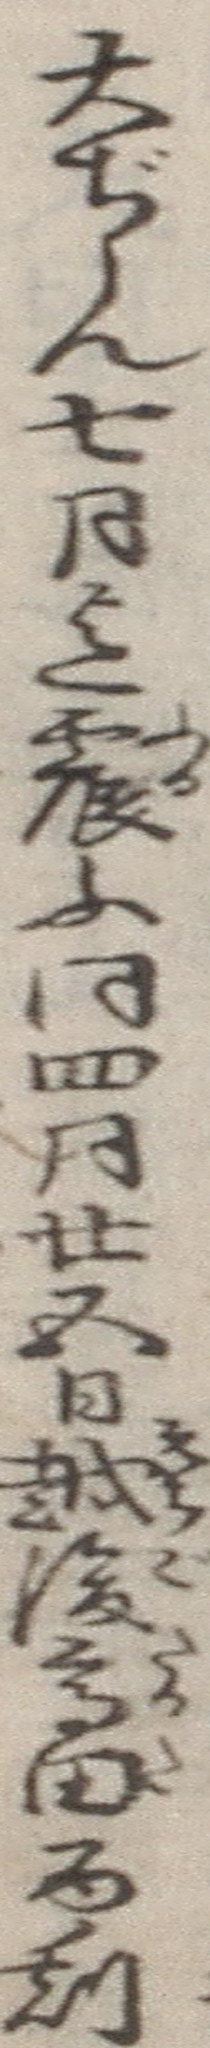大ぢしん七月迄震ふ同四月廿五日越後高田酉ノ刻
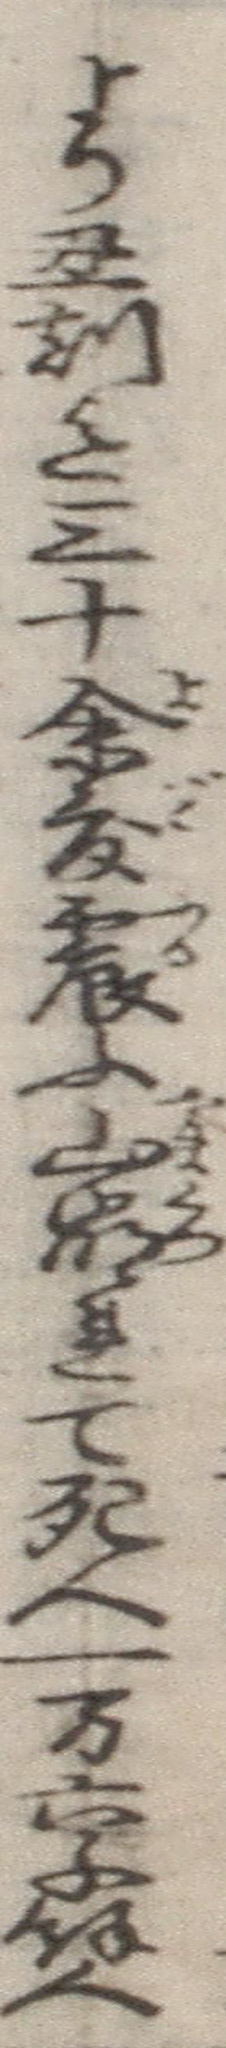より丑刻迄三十余度震ふ山崩れて死人一万六千余人
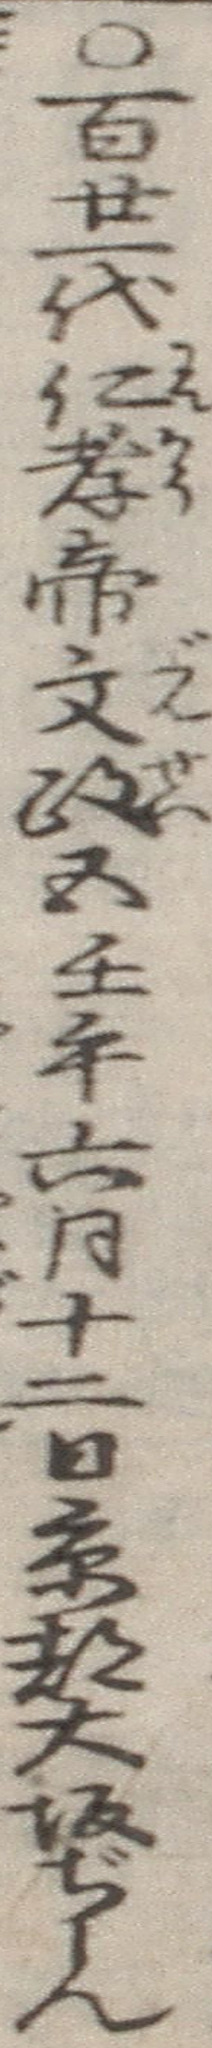○百廿一代仁孝帝文政五壬午六月十二日京都大坂ぢしん
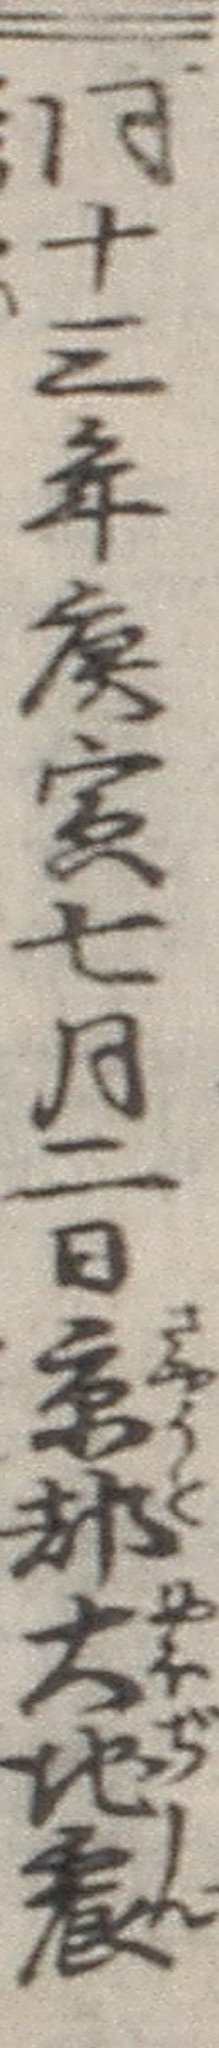同十三年庚寅七月二日京都大地震
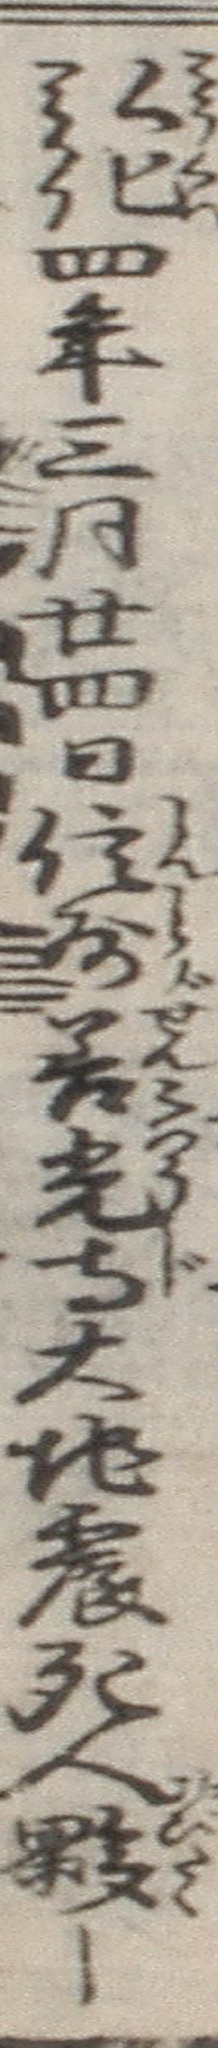弘化四年三月廿四日信州善光寺大地震死人夥し
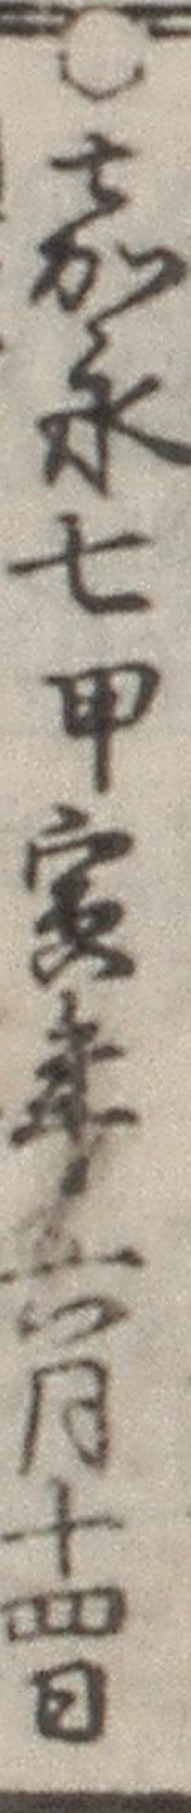○嘉永七甲寅年六月十四日
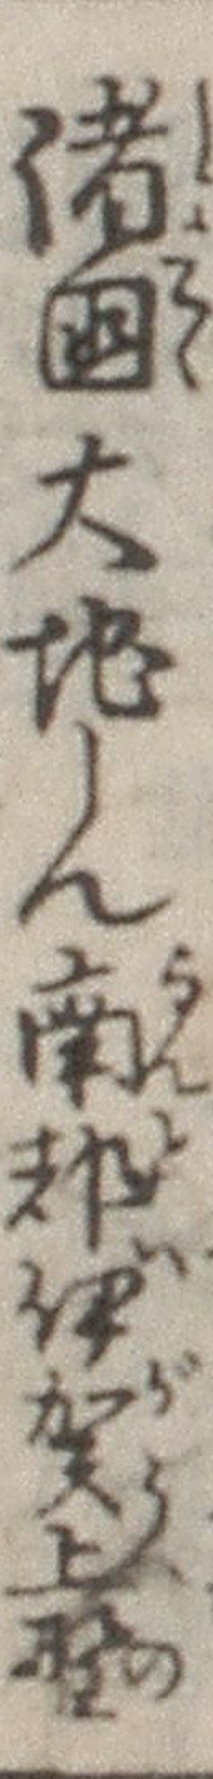諸国大地しん南都伊賀上野
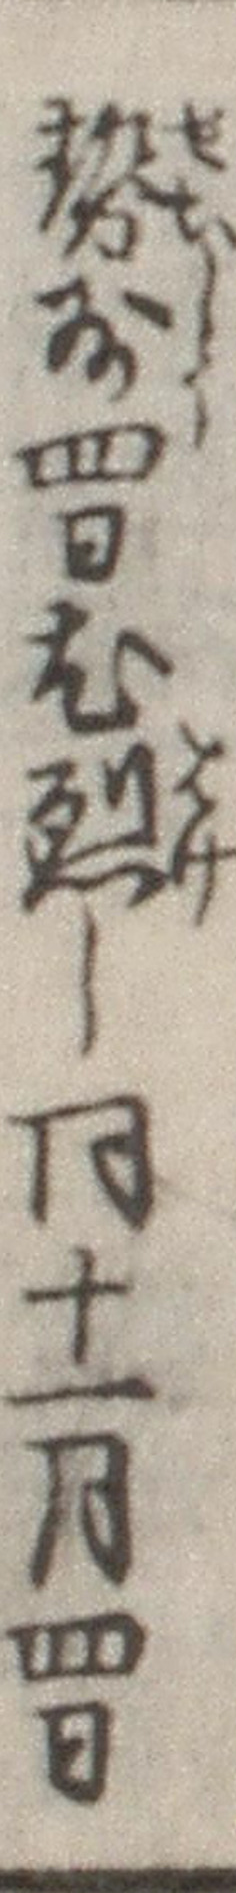勢州四日尤烈し同十一月四日
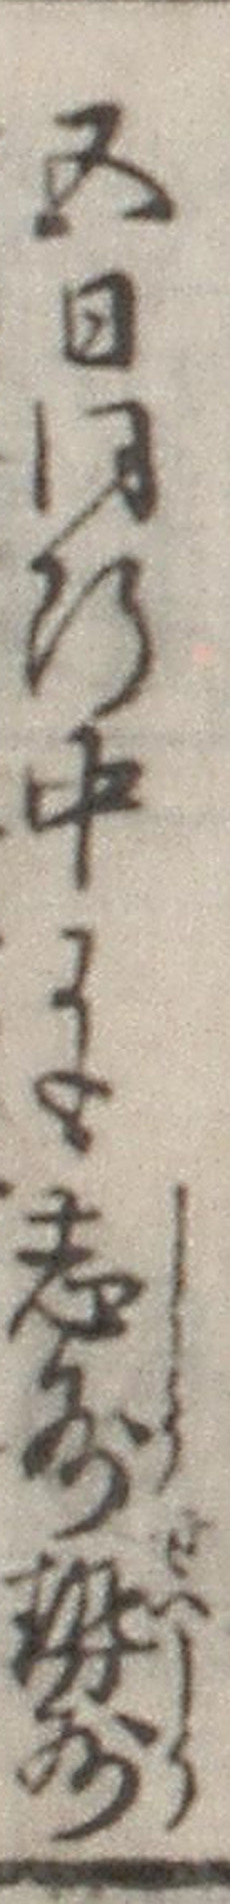五日同断中にも志州勢州
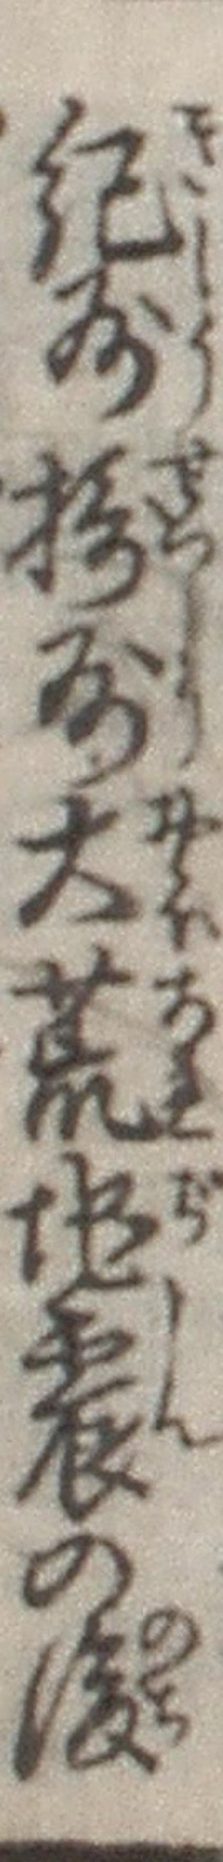紀州摂州大荒地震の後
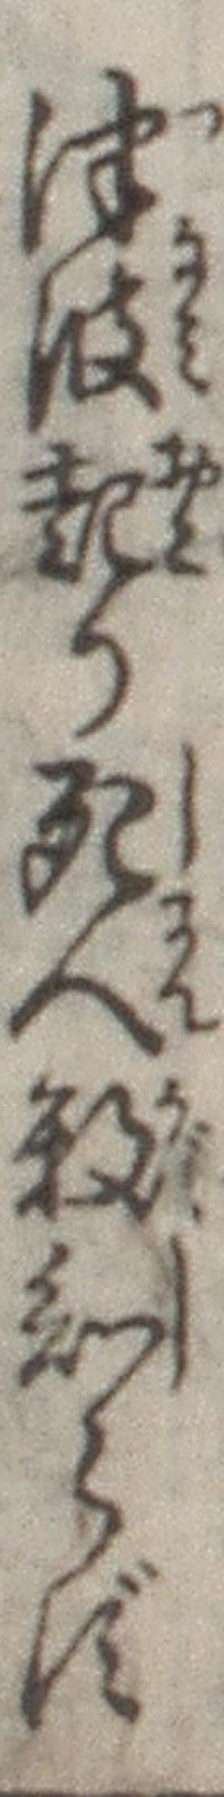津波起り死人数知らず
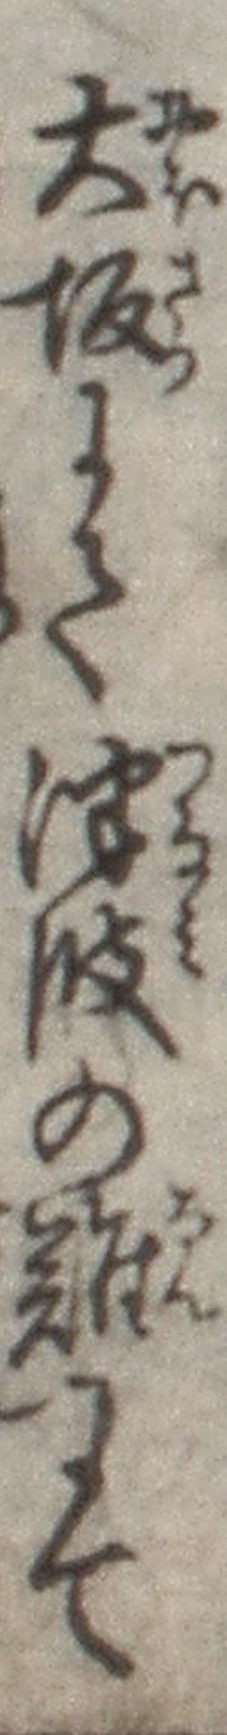大坂にて津波の難にて
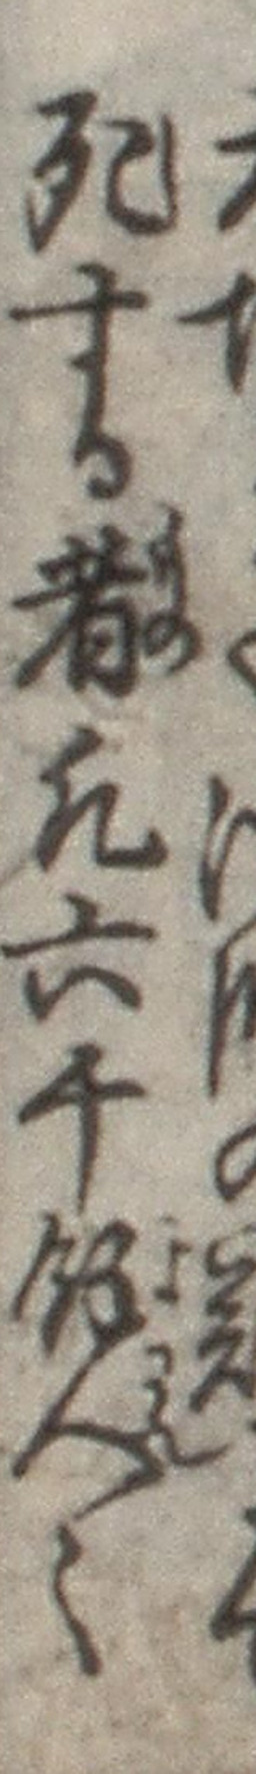死する者凡六千余人也

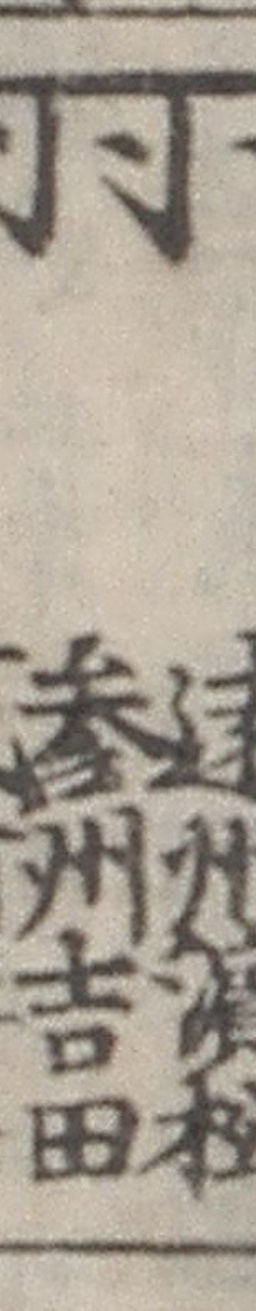同参州吉田
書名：諸國大地震年代記　末代噺種
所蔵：東京大学地震研究所図書室 Earthquake Research Institute Library, The University of Tokyo, JAPAN
